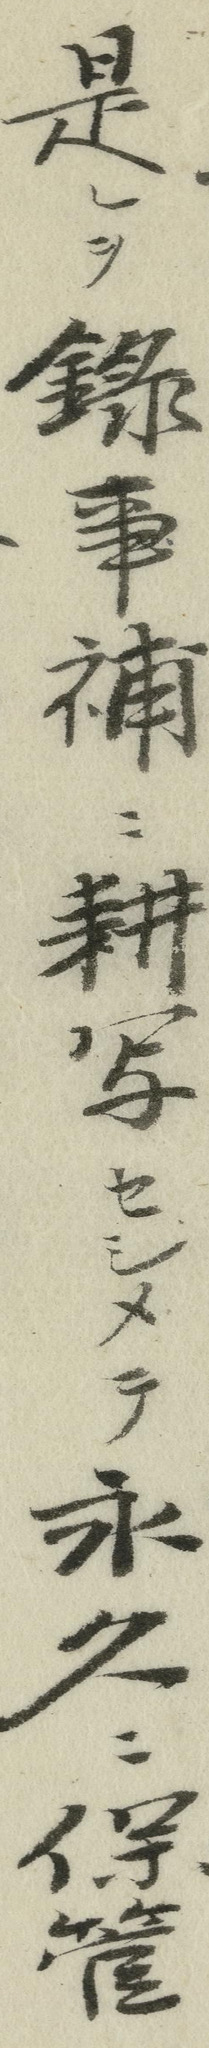是レヲ録事補ニ耕写セシメテ永久ニ保管
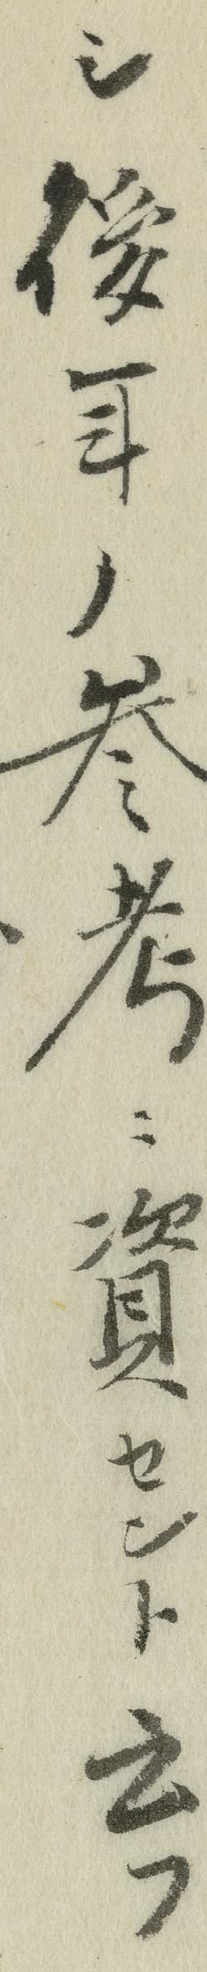シ後年ノ参考ニ資セント云フ
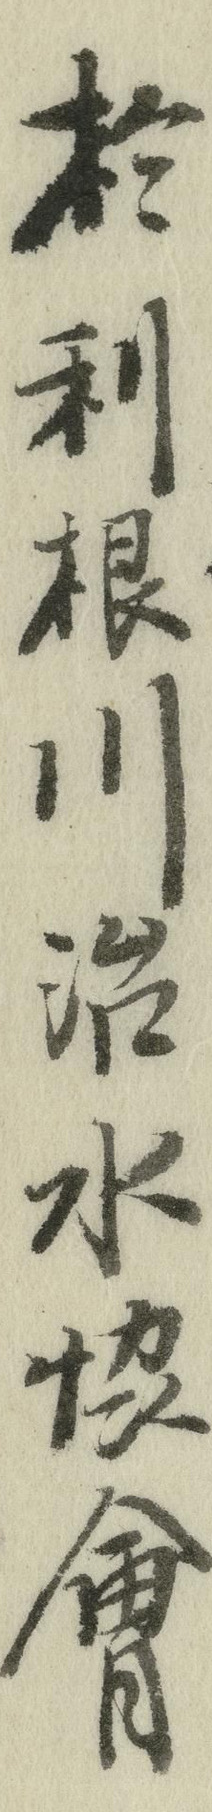於利根川治水協会
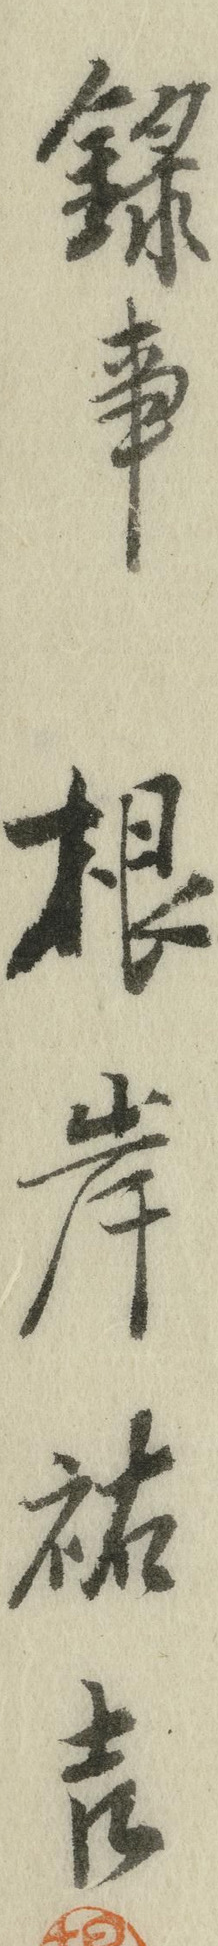録事根岸祐吉
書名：天明三癸卯七月信州浅間山焼出シ上州山津浪ニ付近國ヨリ御届書并訴書写
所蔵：東京大学地震研究所図書室 Earthquake Research Institute Library, The University of Tokyo, JAPAN
